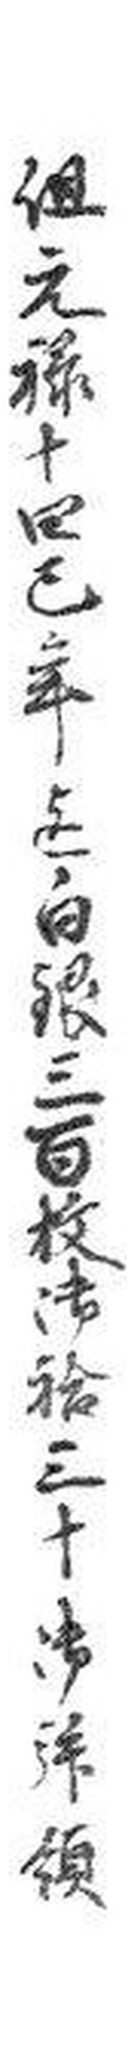但元禄十四巳年迄白銀三百枚御袷三十御拝領
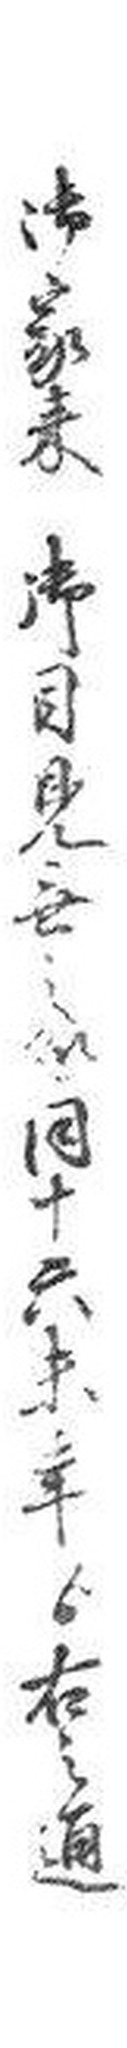御家来御目見無之処同十六未年ゟ右之通
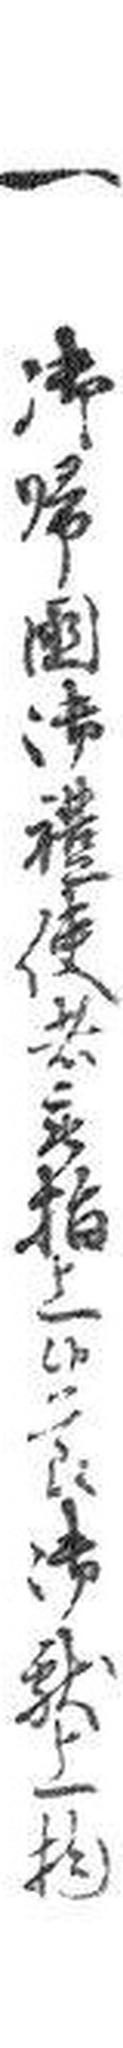一御帰国御礼使者被指上候節御献上物
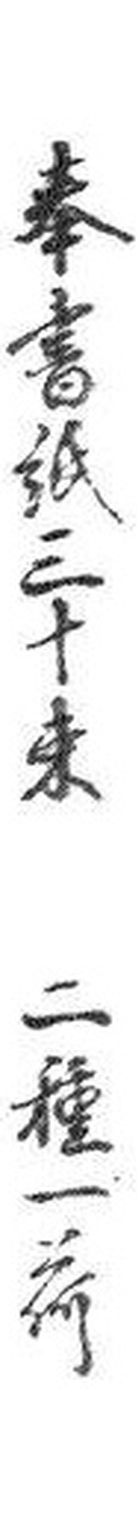奉書紙三十束二種一荷
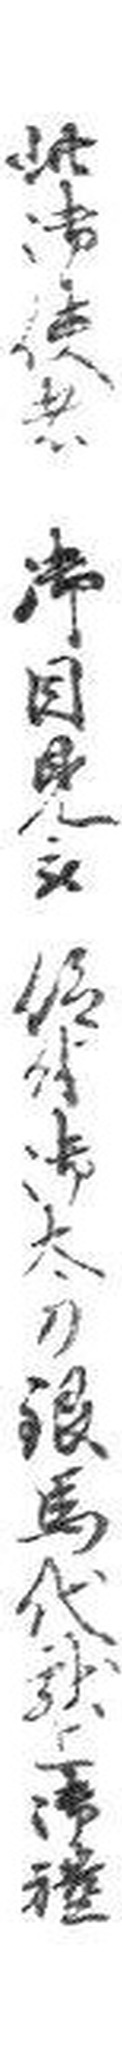此御使者御目見被仰付御太刀銀馬代献上御礼
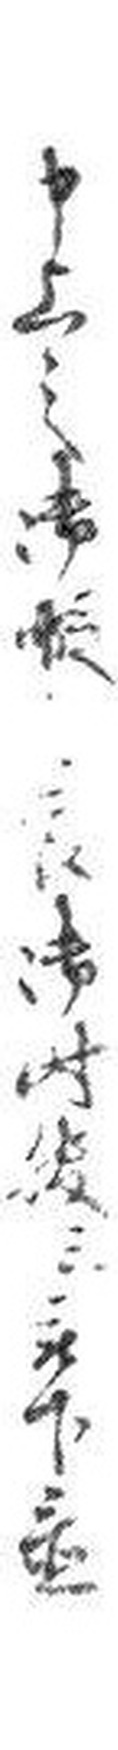申上之御暇之節御時服三被下置
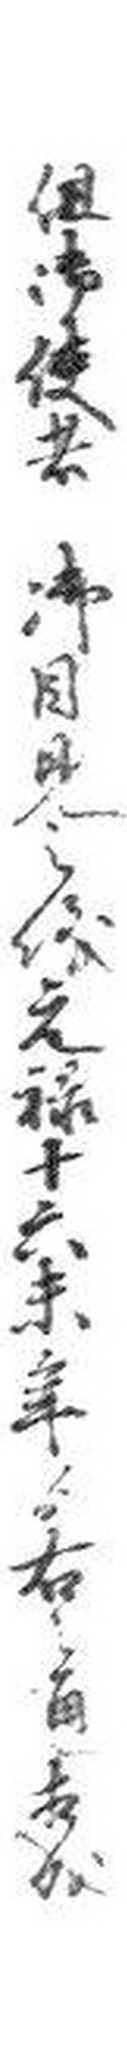但御使者御目見之儀元禄十六未年ゟ右之通相成
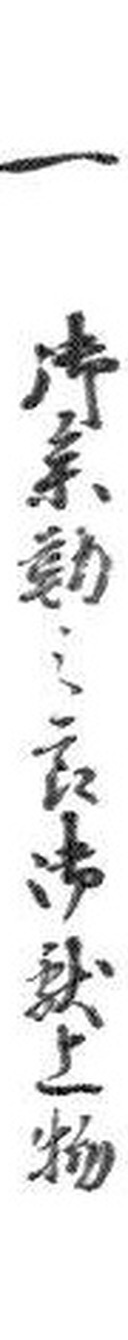一御参勤之節御献上物把
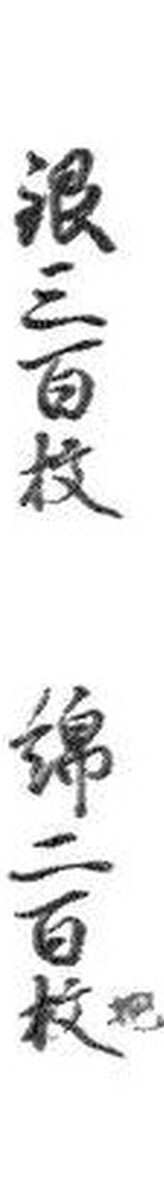銀三百枚綿二百枚
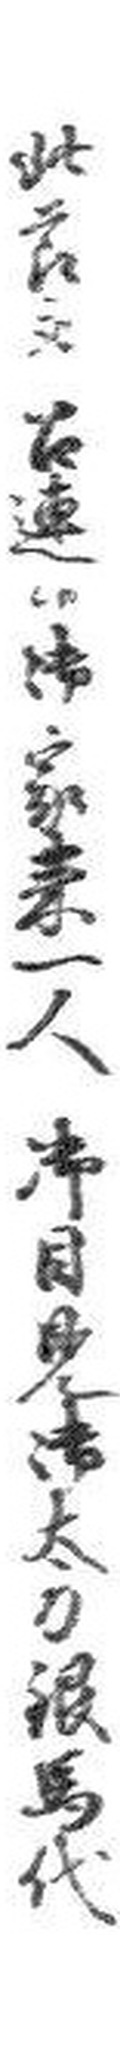此節被召連候御家来一人御目見御太刀銀馬代
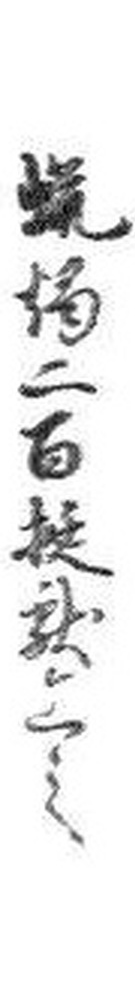蝋燭二百挺献上之
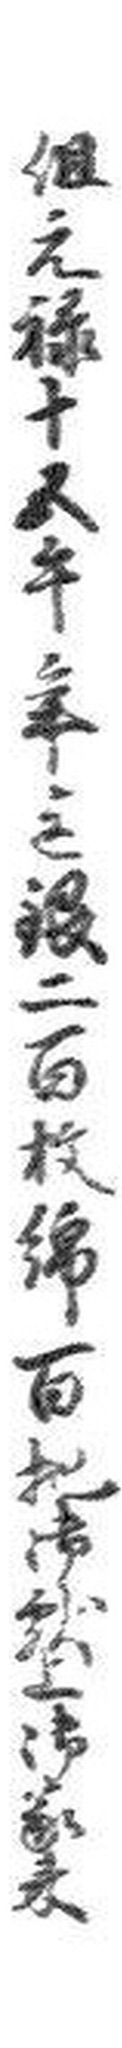但元禄十五午年迄銀二百枚綿百把御献上御家来
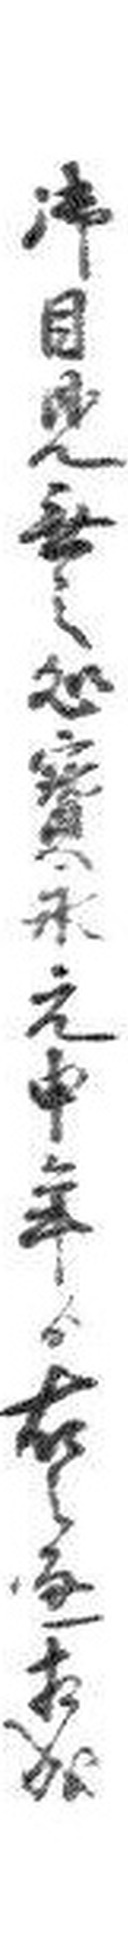御目見無之処宝永元申年ゟ右之通相成
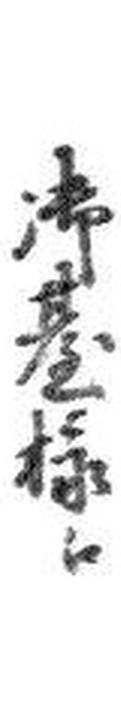御台様江
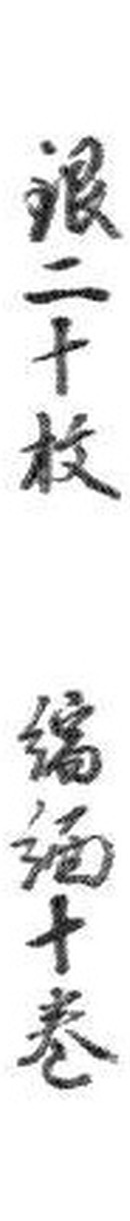銀二十枚縮緬十巻
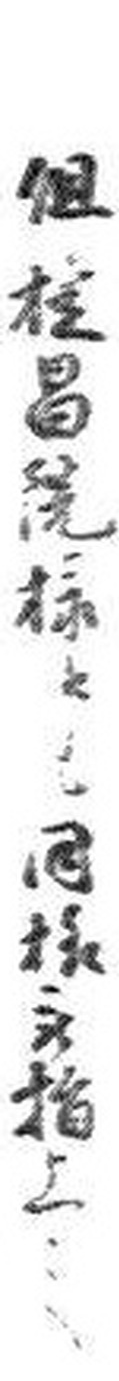但桂昌院様江も同様被指上之
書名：家譜 二十六 吉品公 従宝永七年到正徳二年
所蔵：福井県文書館 Fukui Prefectural Archives
